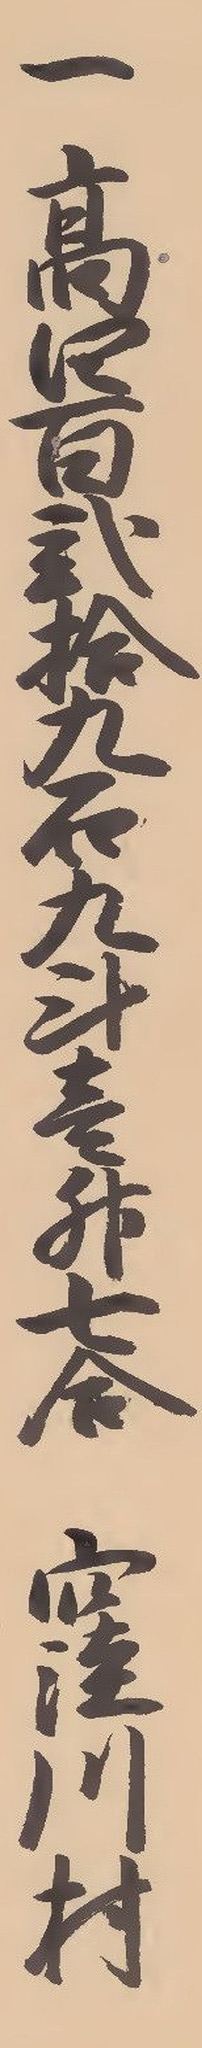一髙四百弐拾九石九斗壱升七合窪川村
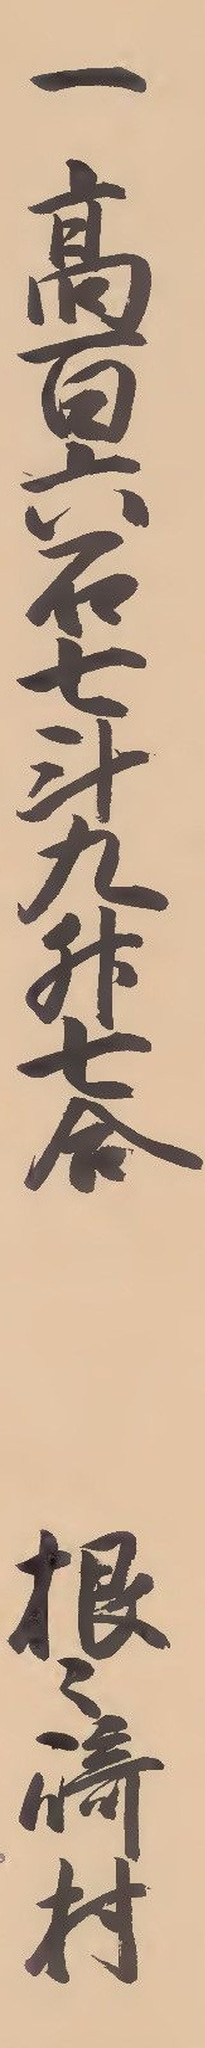一髙百六石七斗九升七合根々崎村
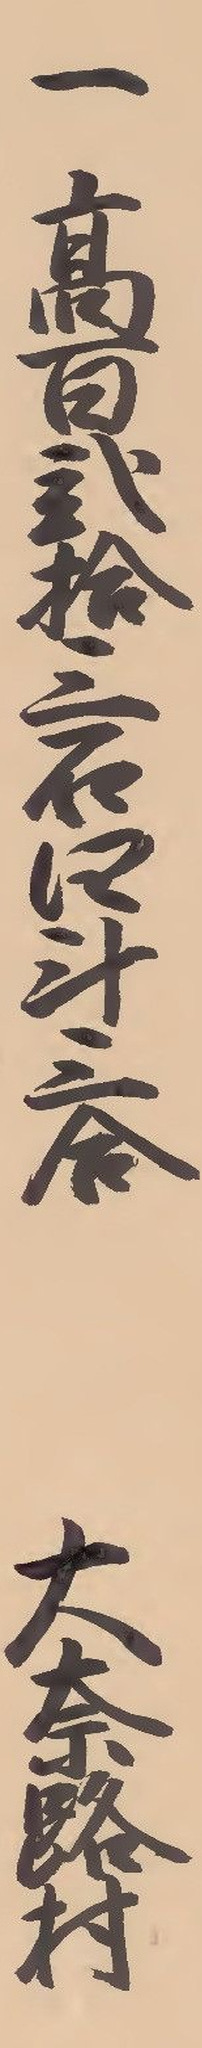一髙百弐拾三石四斗三合大奈路村
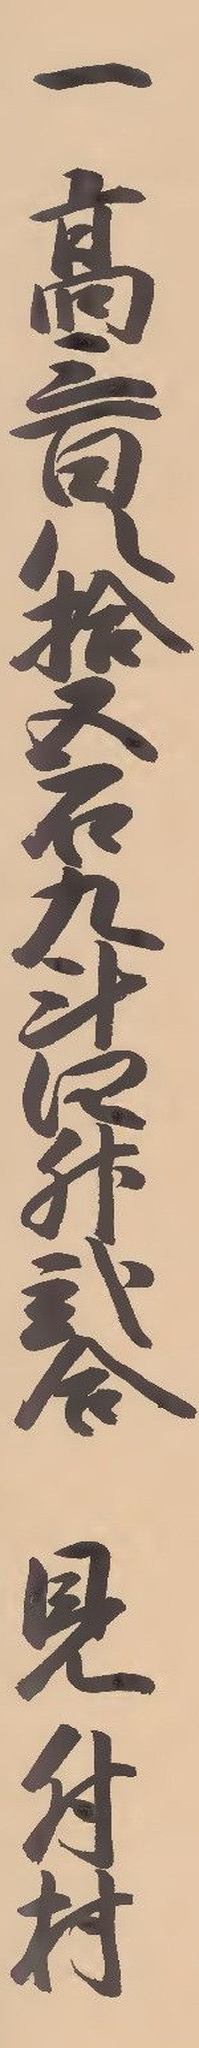一髙三百八拾五石九斗四升弐合見付村
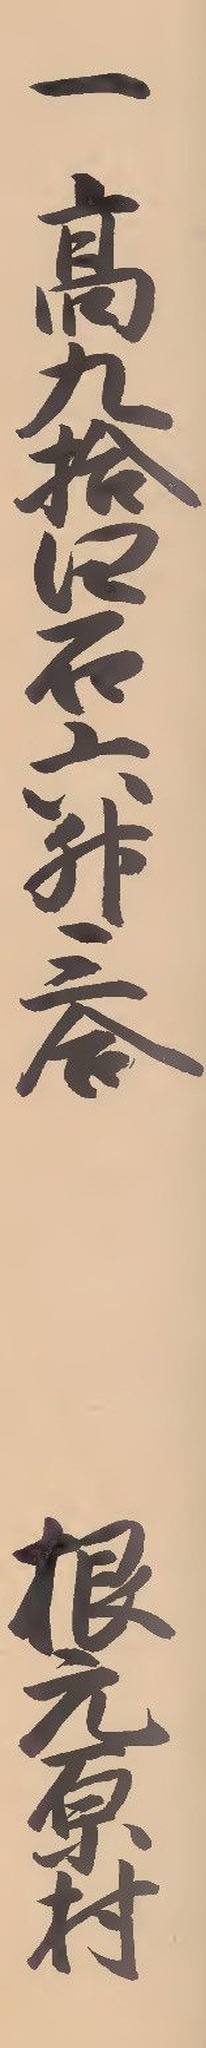一髙九拾四石六升三合根元原村
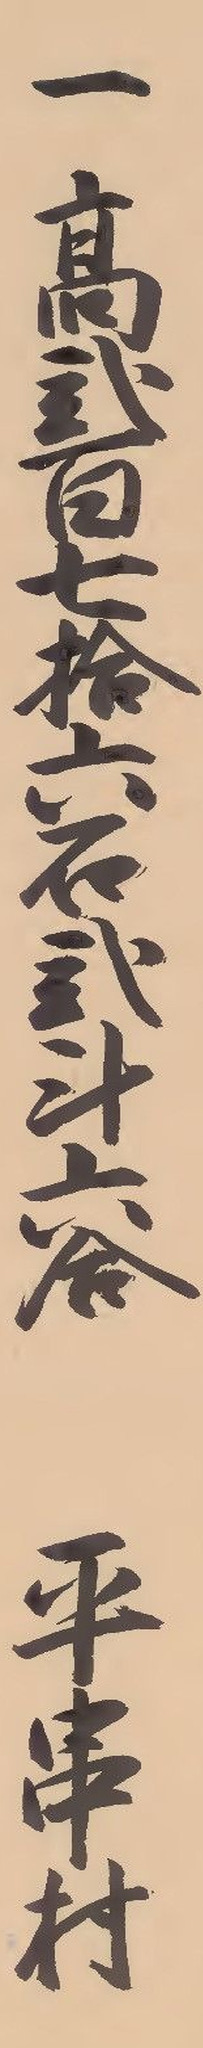一髙弐百七拾六石弐斗六合平串村
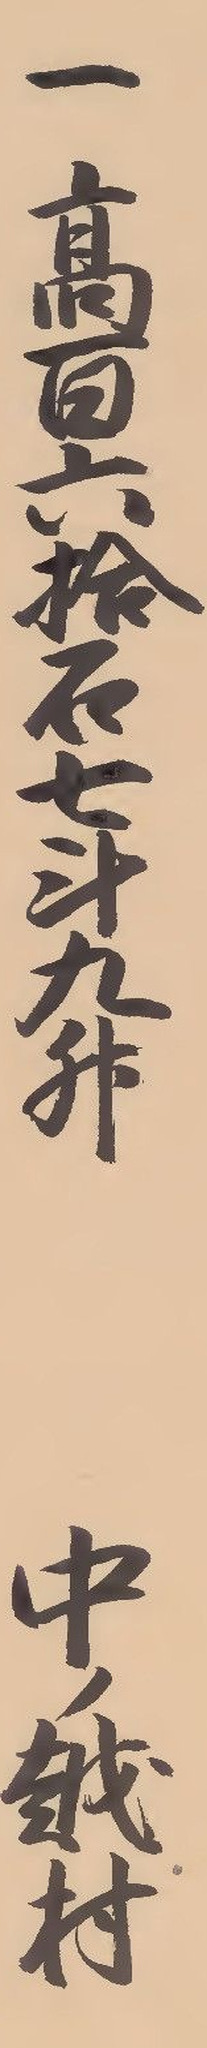一髙百六拾石七斗九升中ノ越村
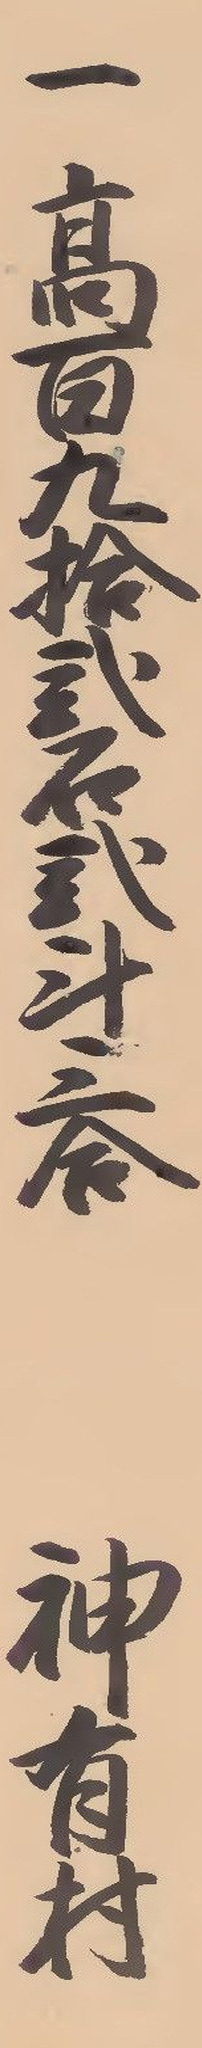一髙百九拾弐石弐斗三合上有村

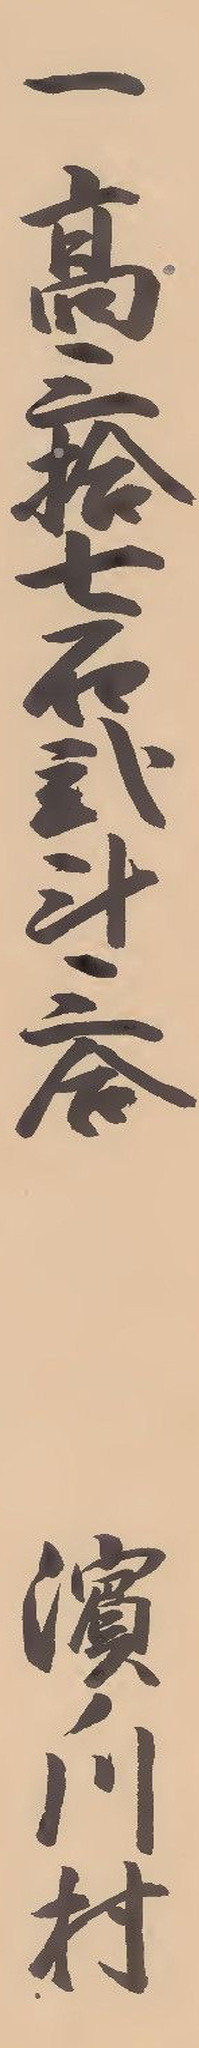一髙三拾七石弐斗三合濱ノ川村
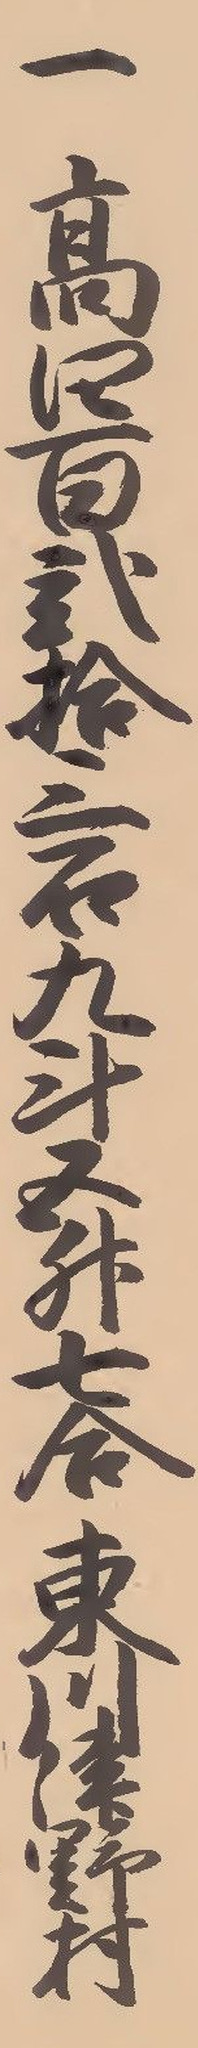一髙四百弐拾三石九斗五升七合東川津野村
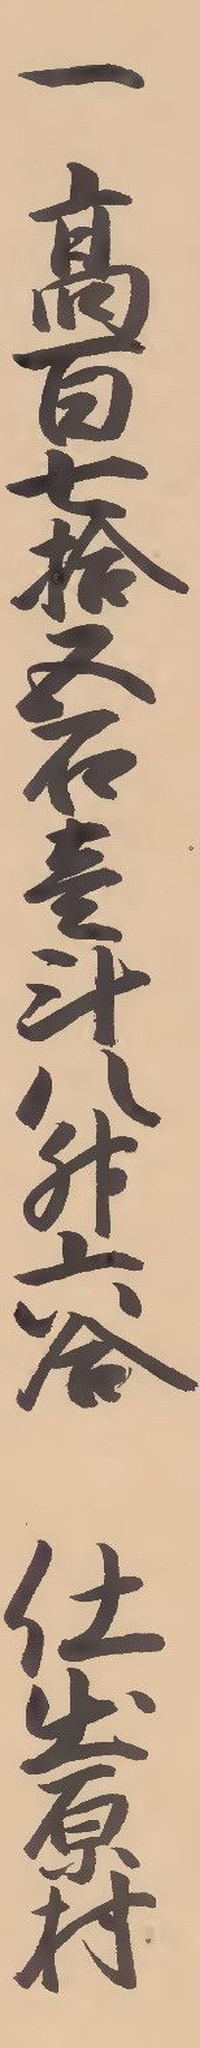一髙百七拾五石壱斗八升六合仕出原村
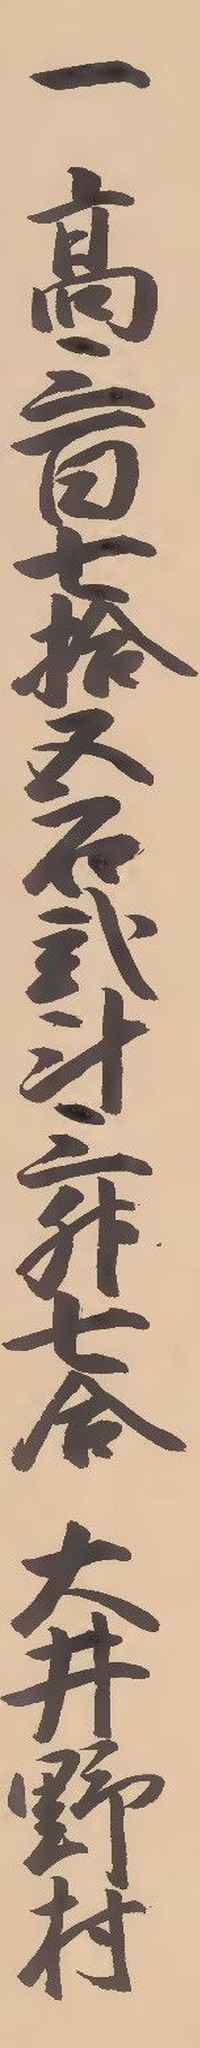一髙三百七拾五石弐斗三升七合大井野村
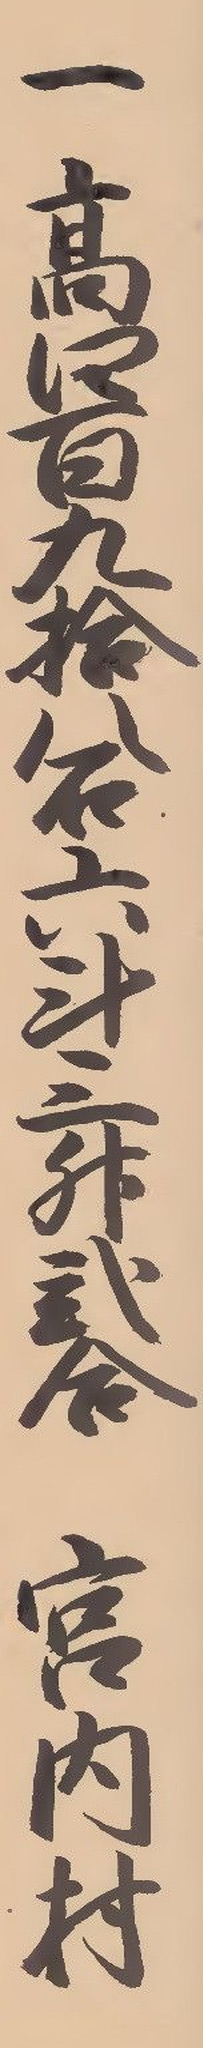一髙四百九拾八石六斗三升弐合宮内村
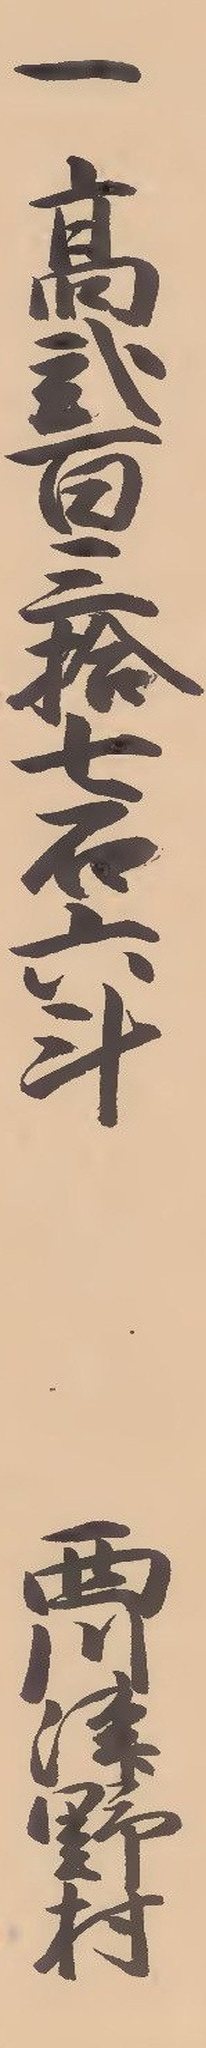一髙弐百三拾七石六斗西川津野村
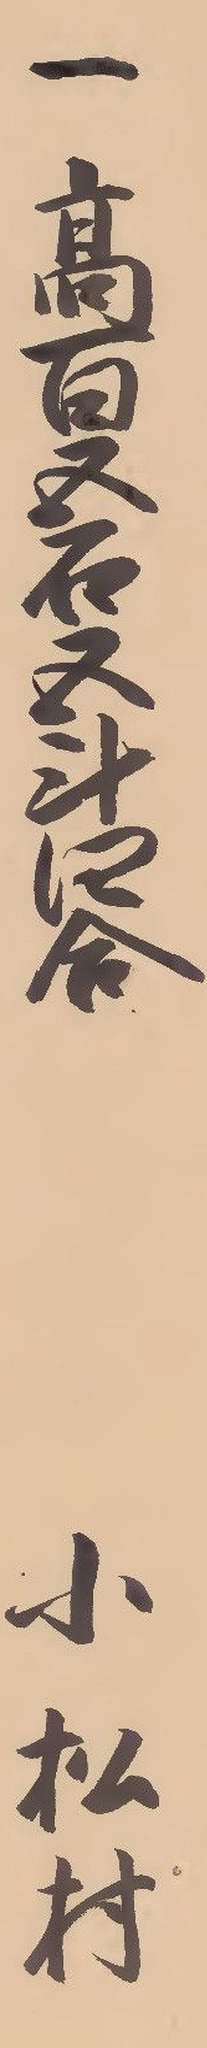一髙百五石五斗四合小松村
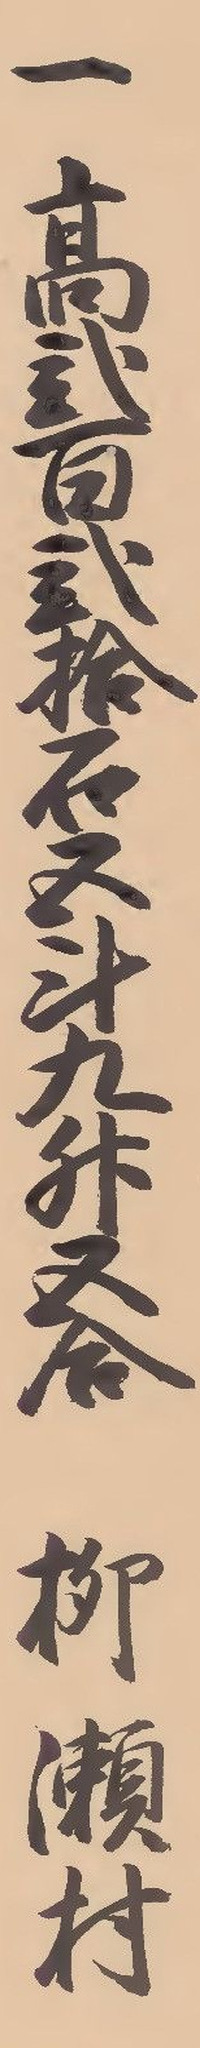一髙弐百弐拾石五斗九升五合柳瀬村
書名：土佐国郷帳
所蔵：国立公文書館 National Archives of Japan
